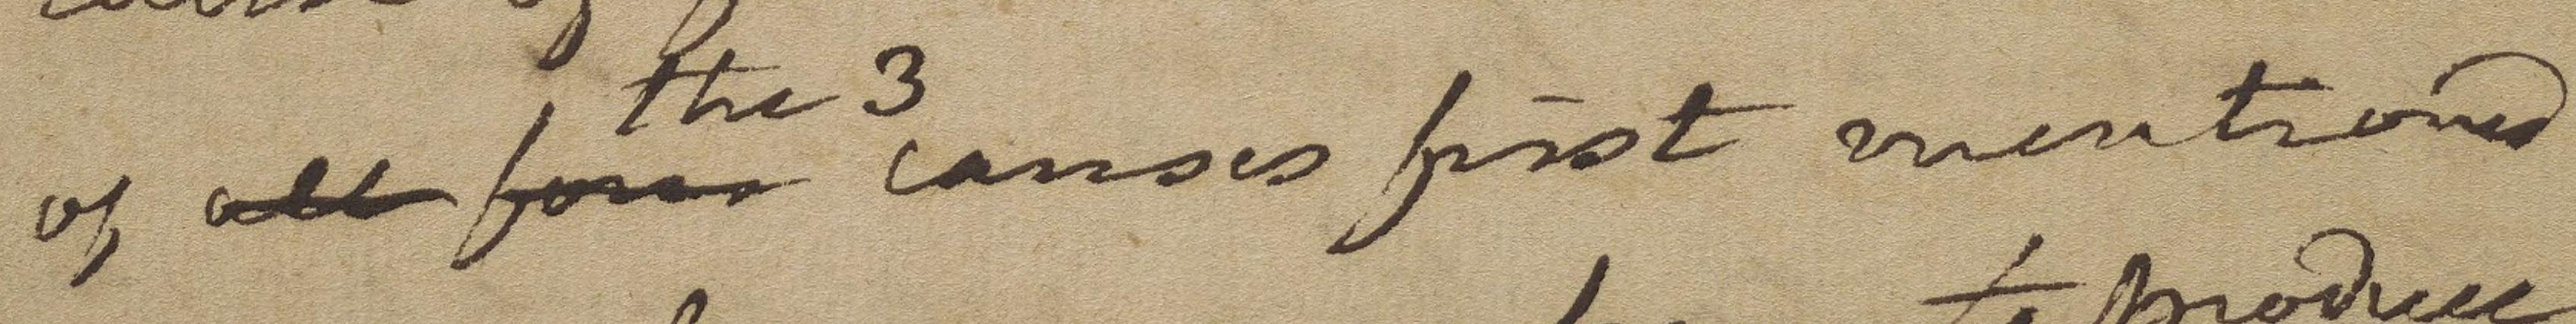of [all four] causes first mentioned
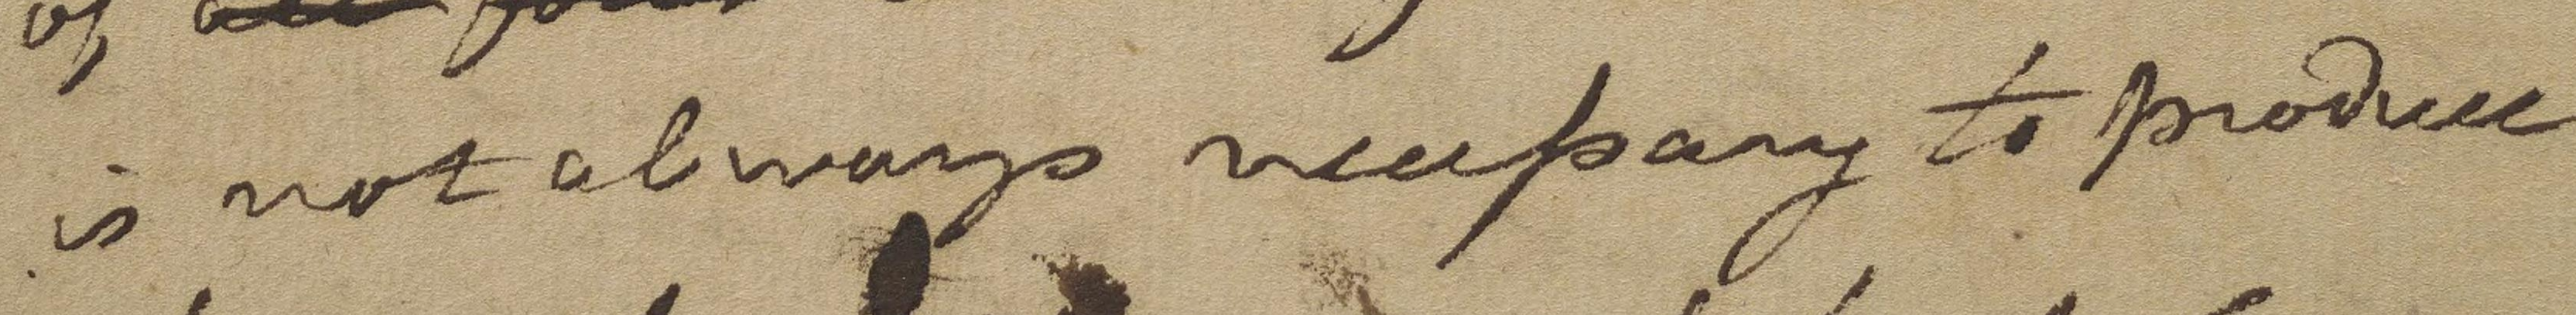is not always necessary to produce
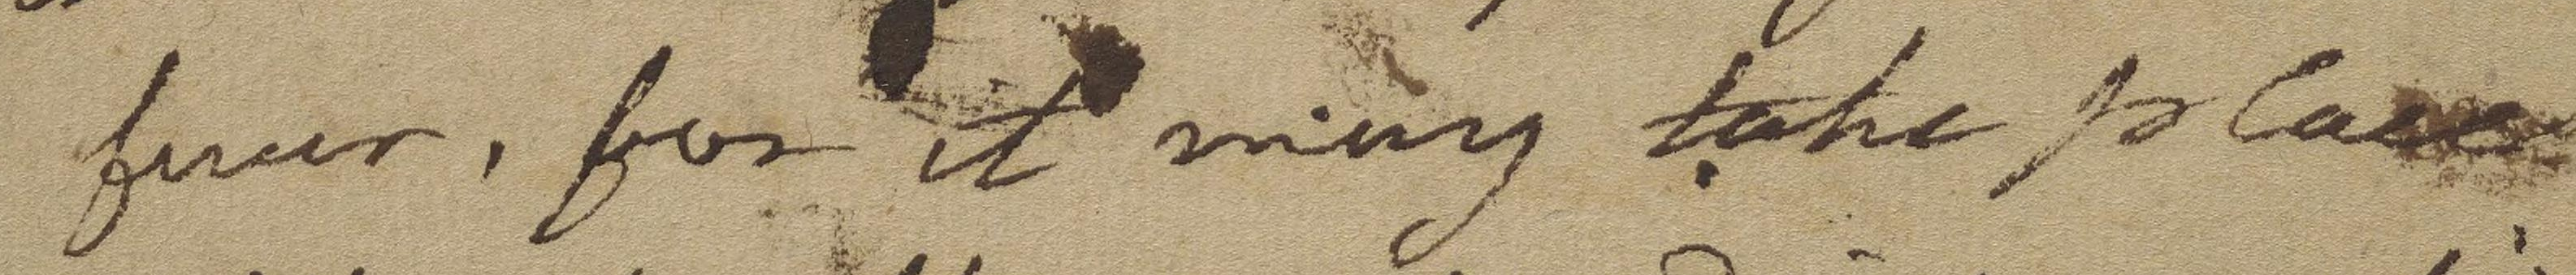fever, for it may take so care
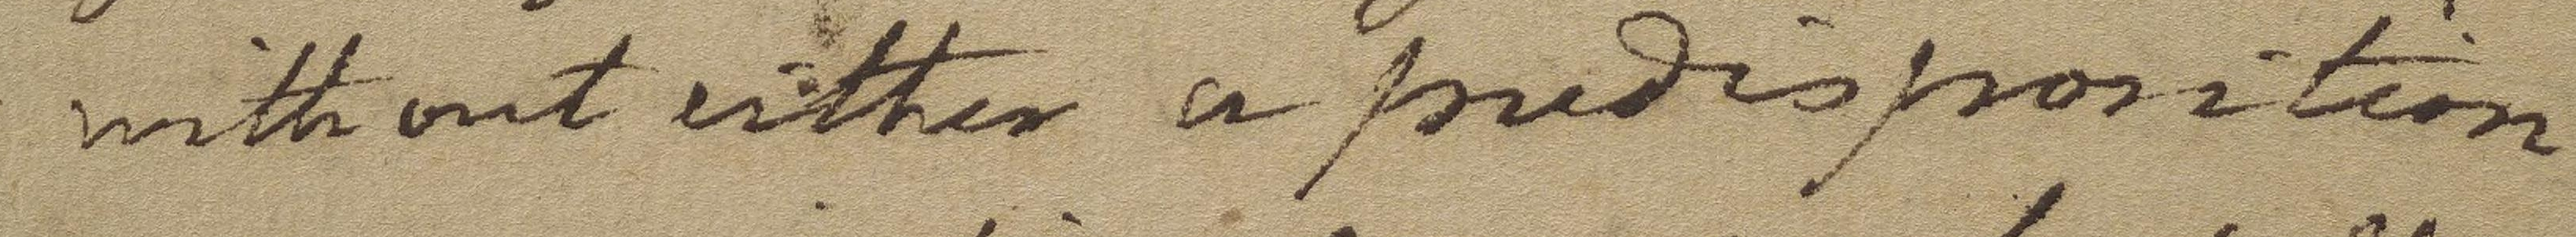without either a predisposition
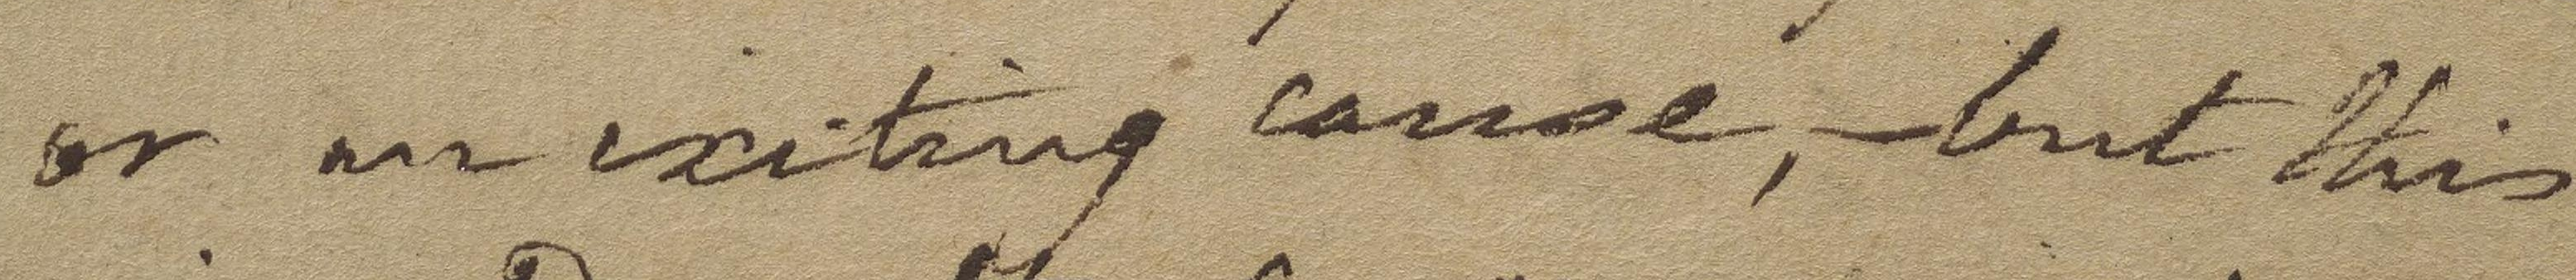or an exciting cause,- but this
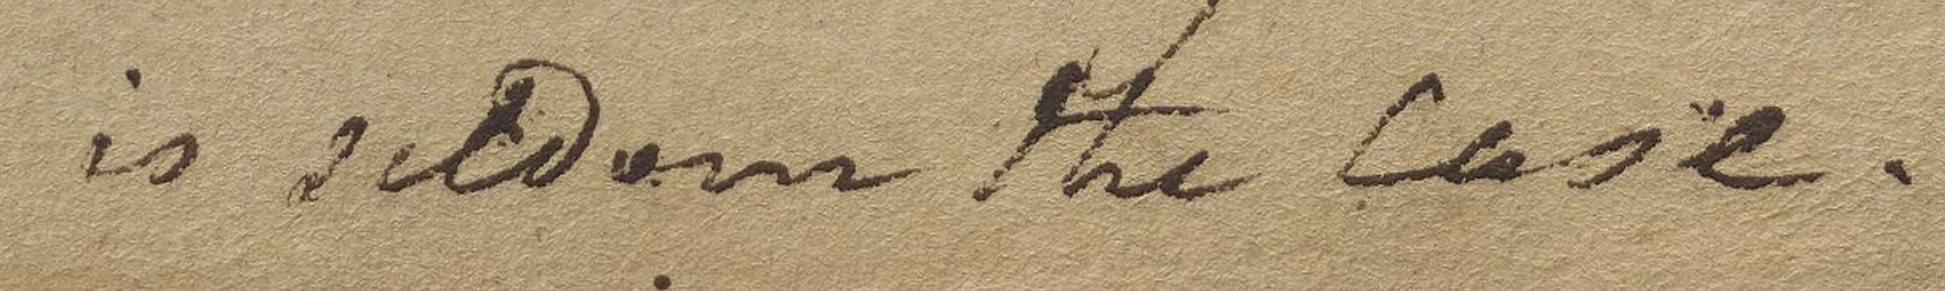is seldom the case.
